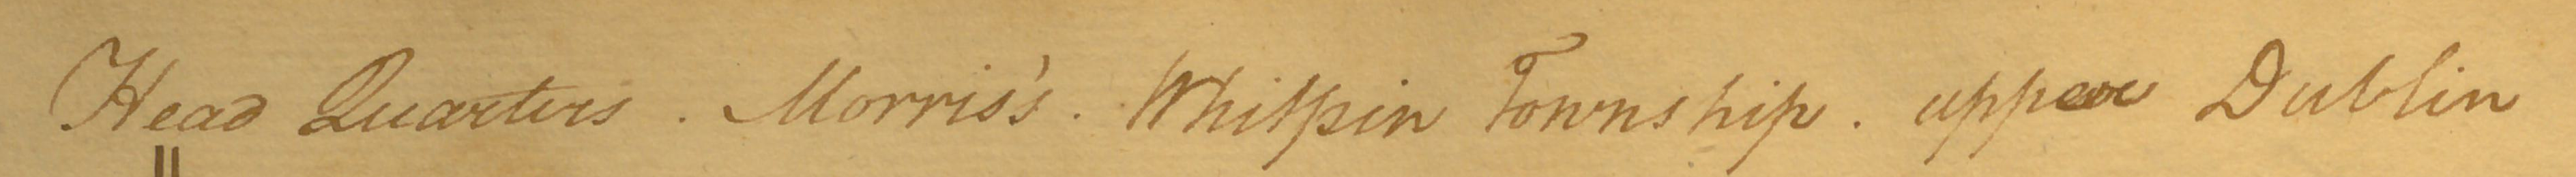Head Quarters. Morris's Whitpin Township. upper Dublin
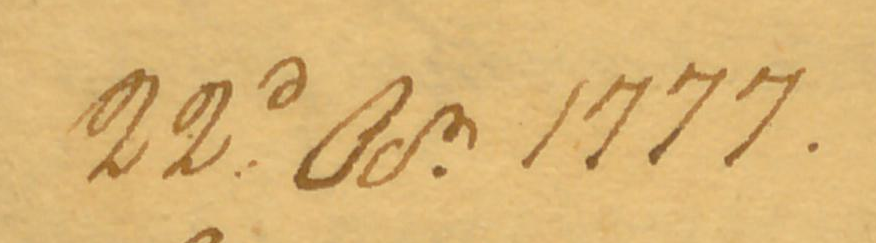22^d. Oc^r. 1777.
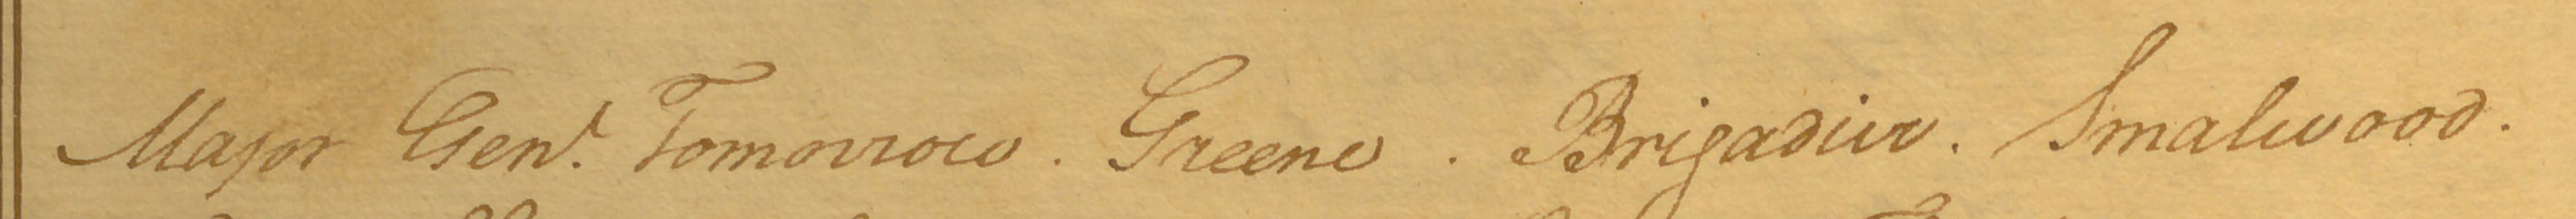Major Gen^l. Tomorrow. Greene. Brigadier Smalwood.
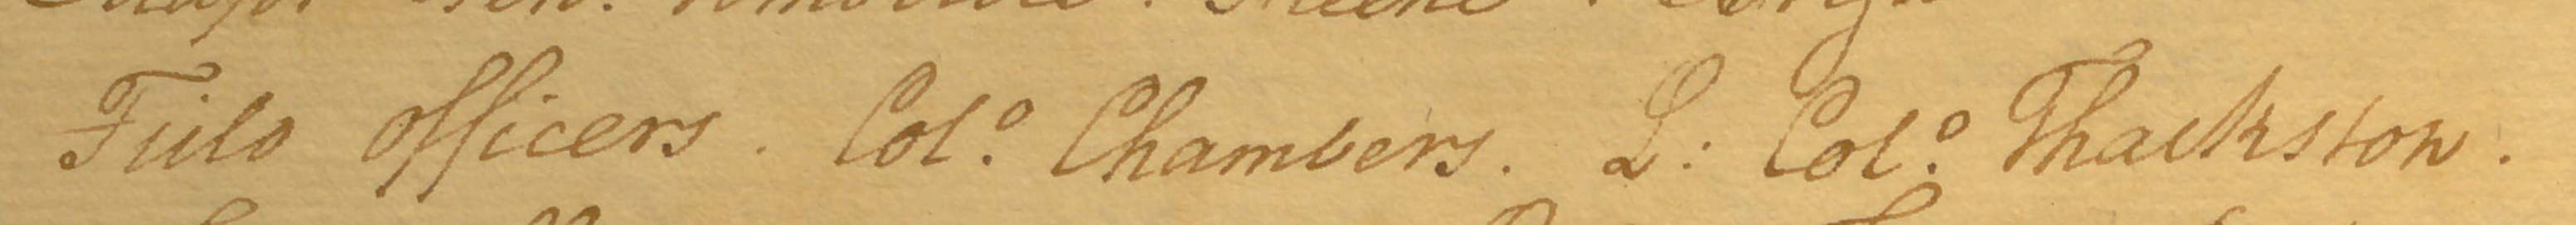Field officers Col^o. Chambers. L: Col^o. Thackston.
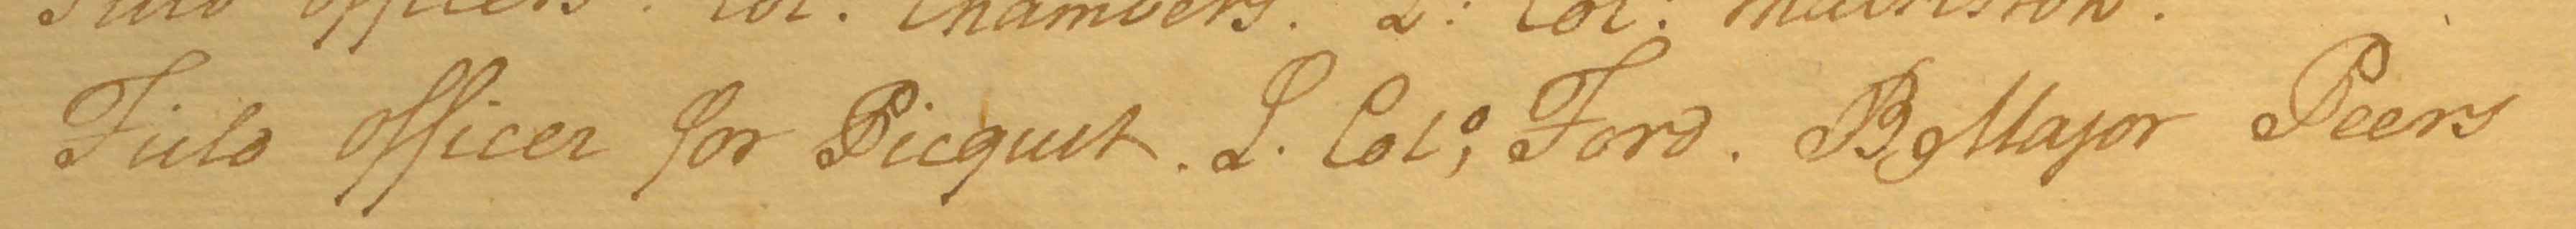Field officer for Picquet. L. Col^o. Ford. B Major Peers
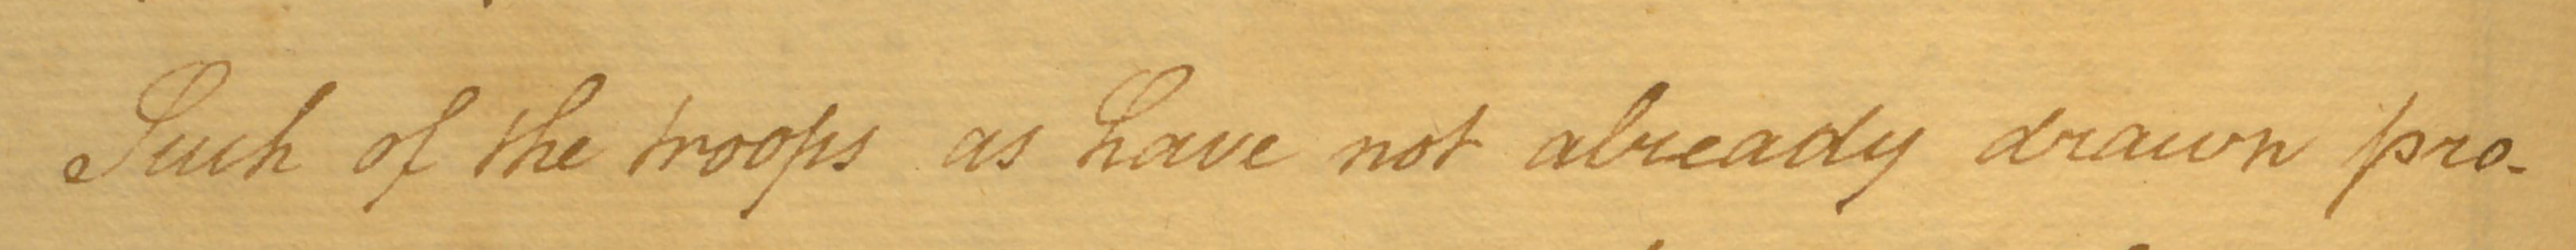Such of the troops as have not already drawn pro-
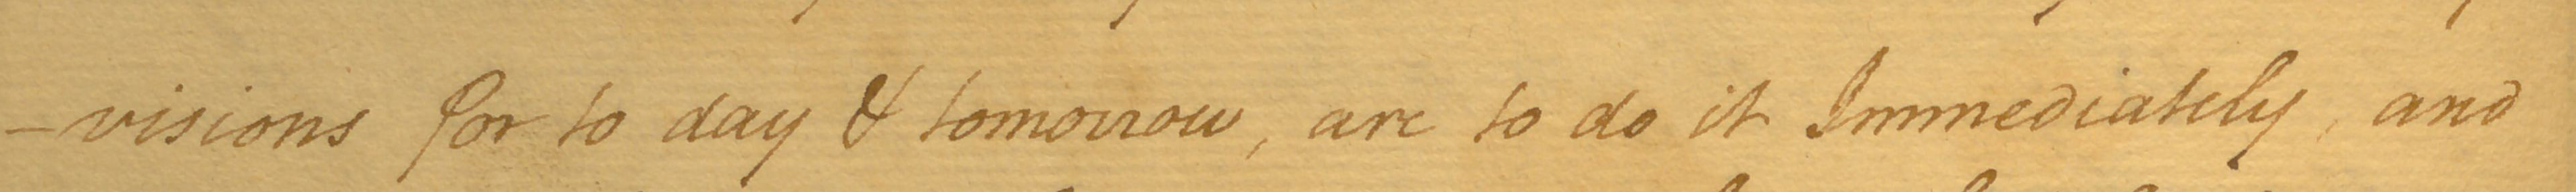-visions for to day & tomorrow, are to do it Immediately and
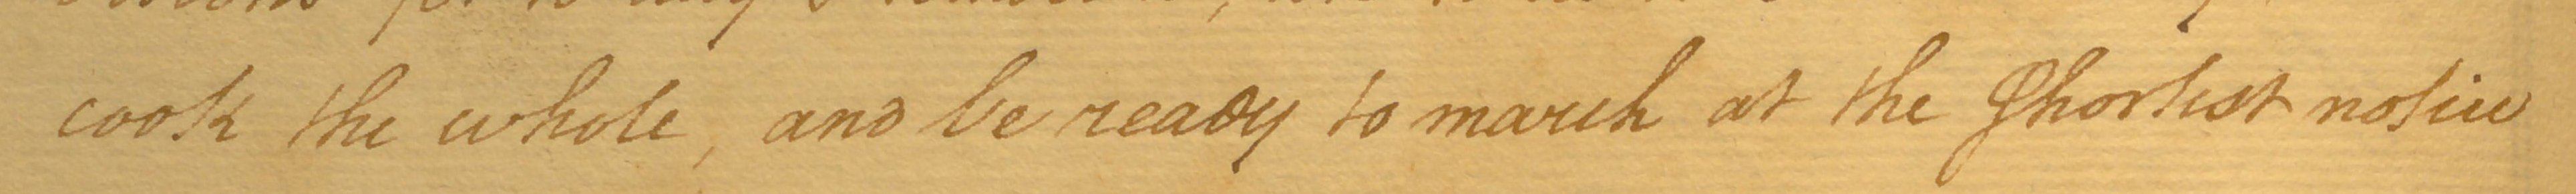cook the whole, and be ready to march at the shortest notice
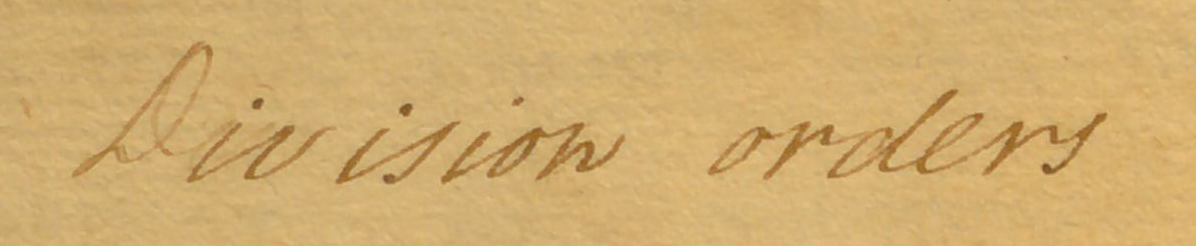Division orders
